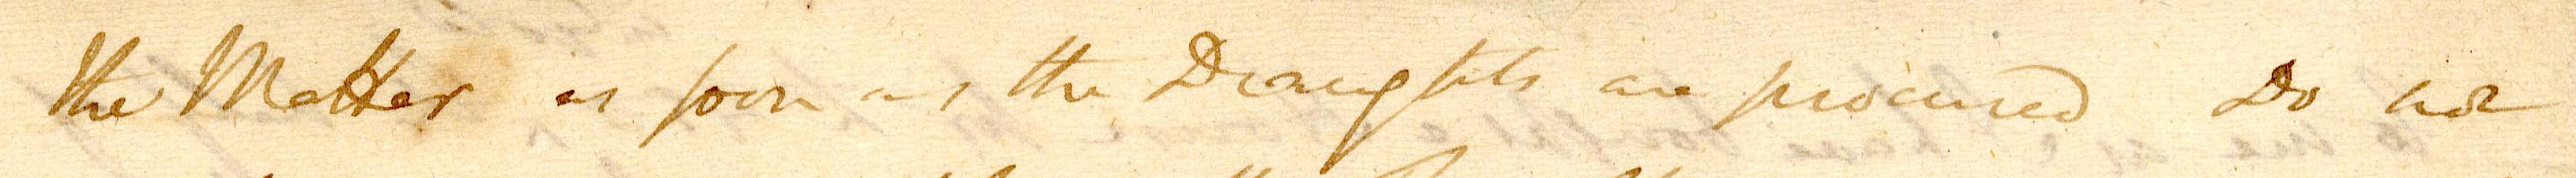the Matter as soon as the Draughts are procured. Do not
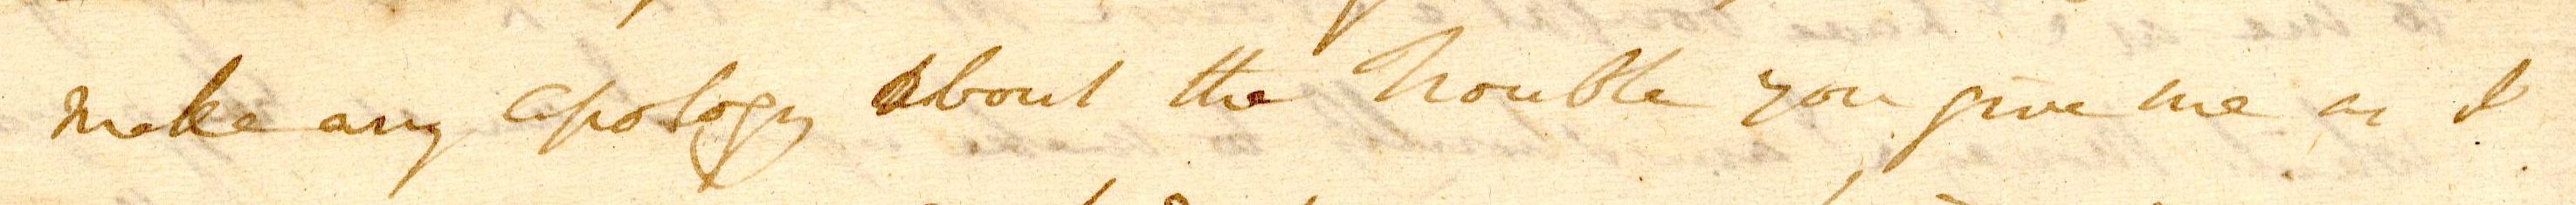make any apology about the Trouble you give me as I
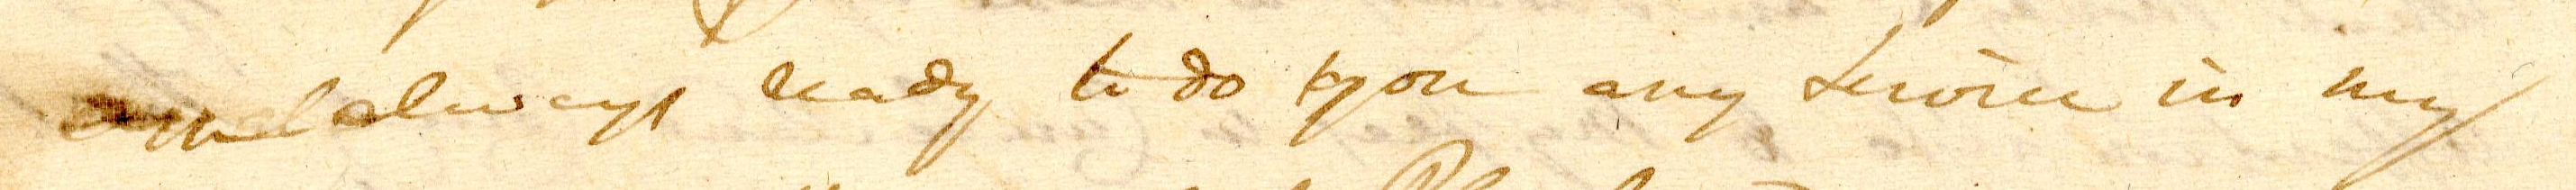am always ready to do you any Service in my
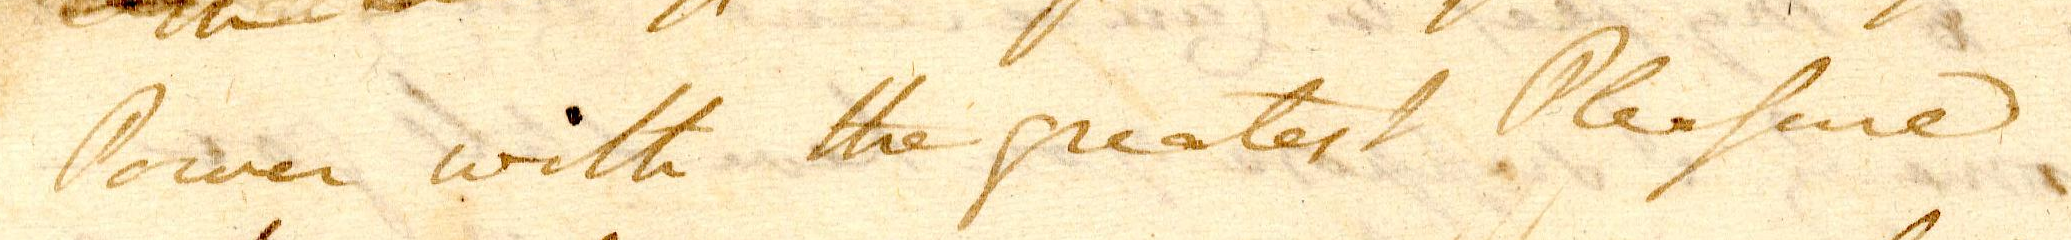Power with the greatest Pleasure
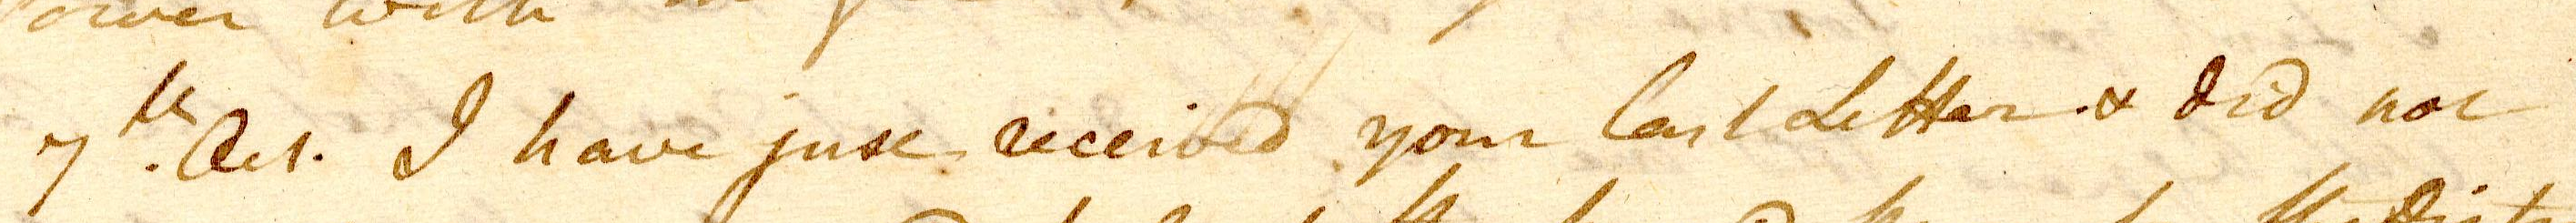7^th. Oct. I have just received your last Letter & did not
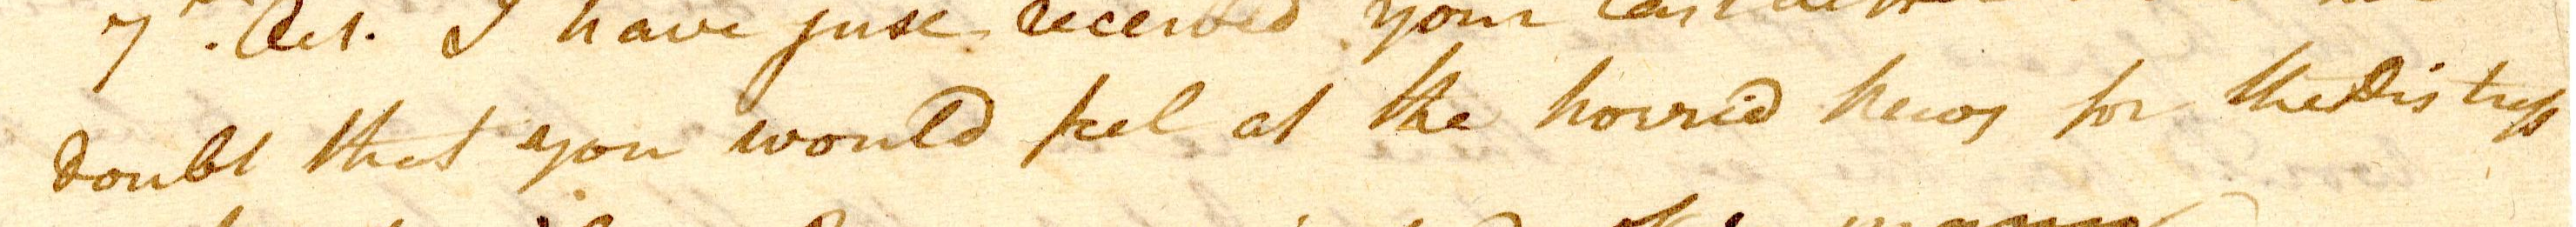doubt that you would feel at the horrid news for the distress
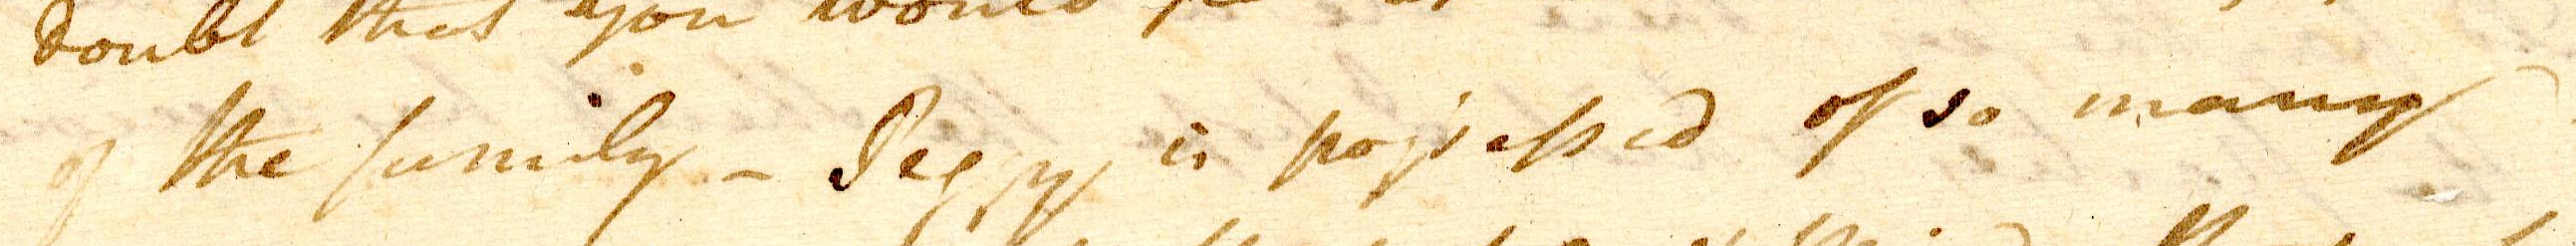of the family. Peggy is possessed of so many
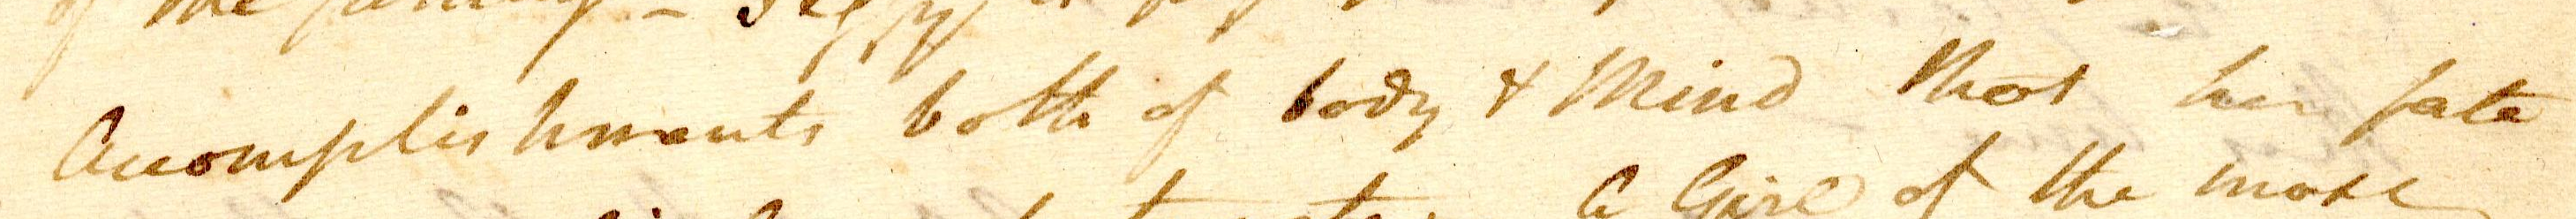Accomplishments both of body & Mind that her fate
